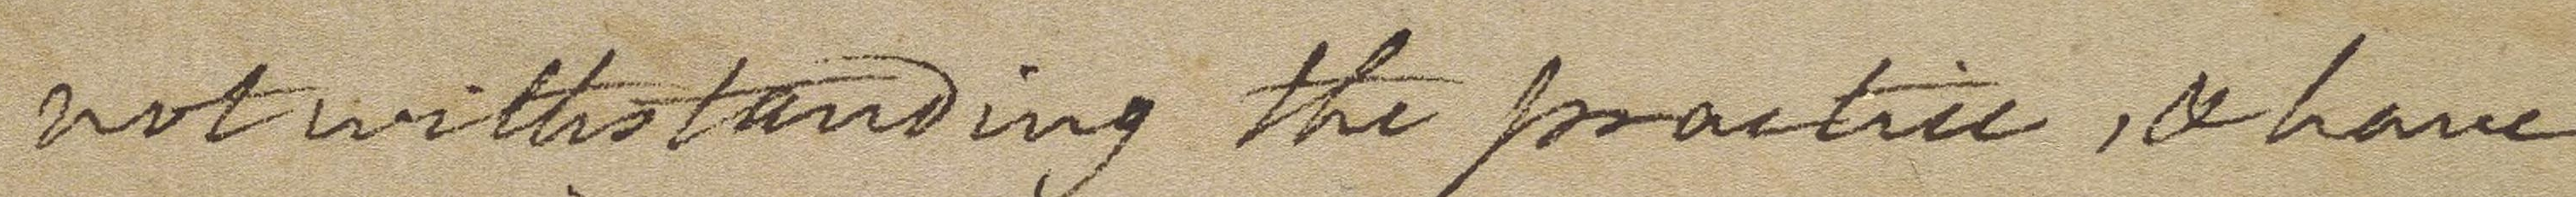notwithstanding the practice, & have
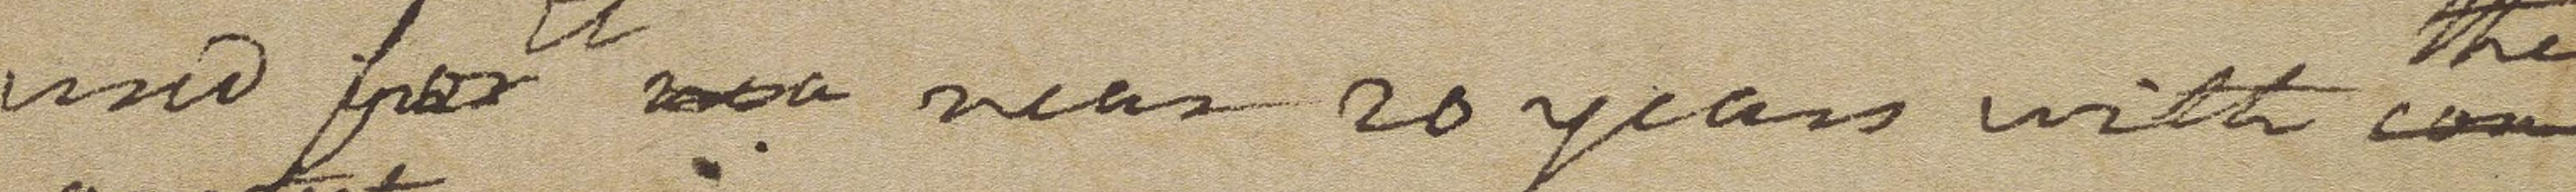and [for] it [nea] near 20 years with [con]
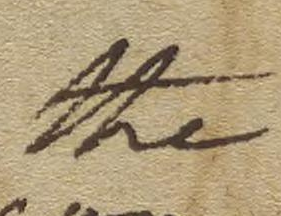the
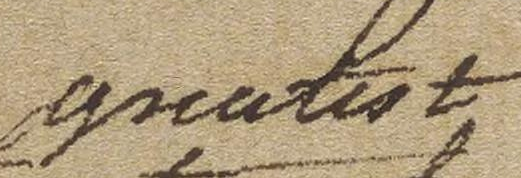greatest
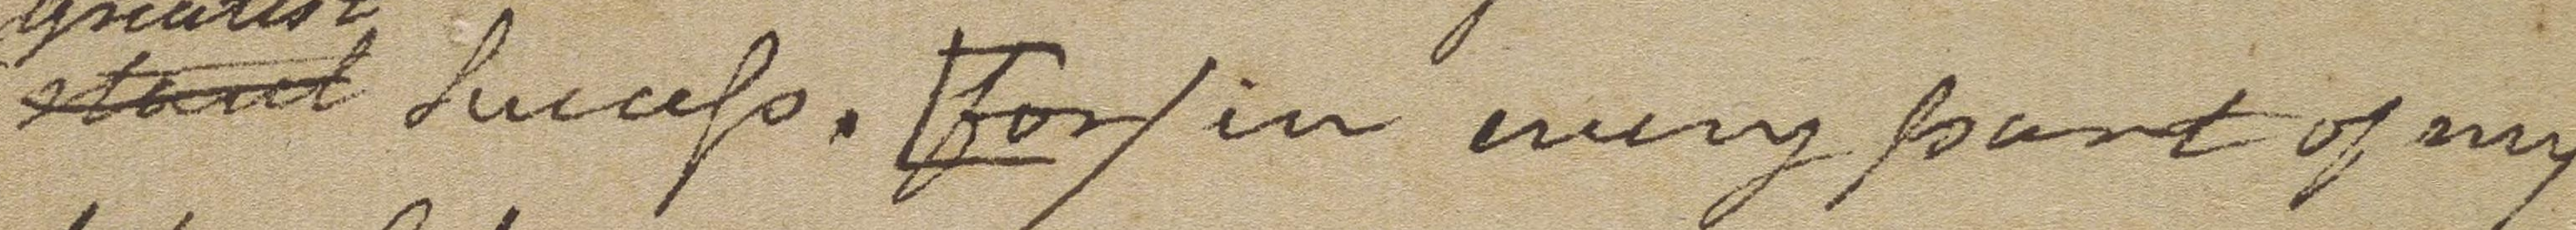[stant] success. (For in every part of my
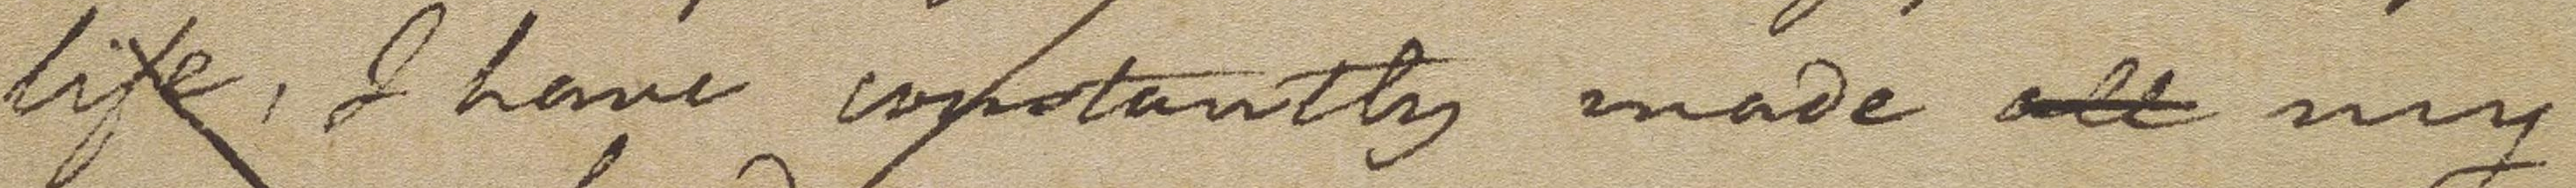life, I have constantly made [all] my
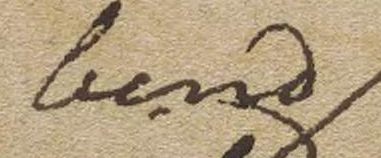bend
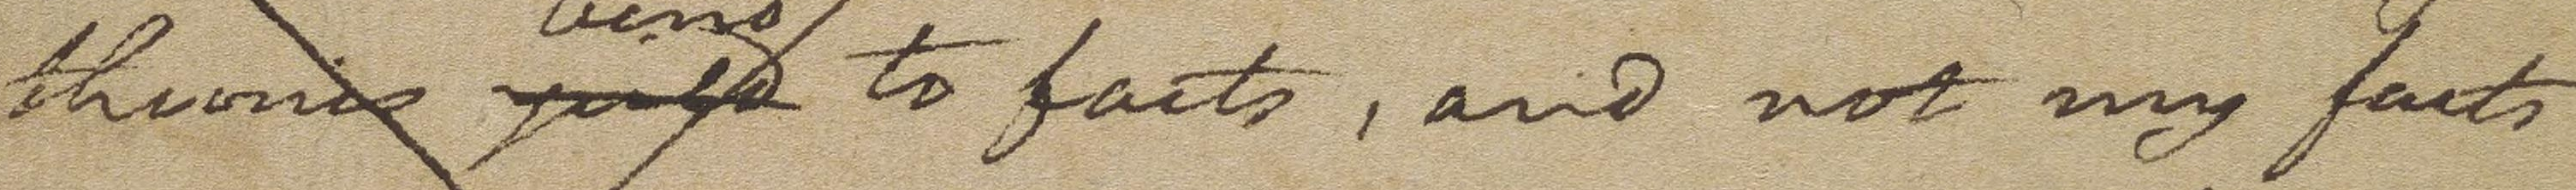theories [yield] to facts, and not my facts
